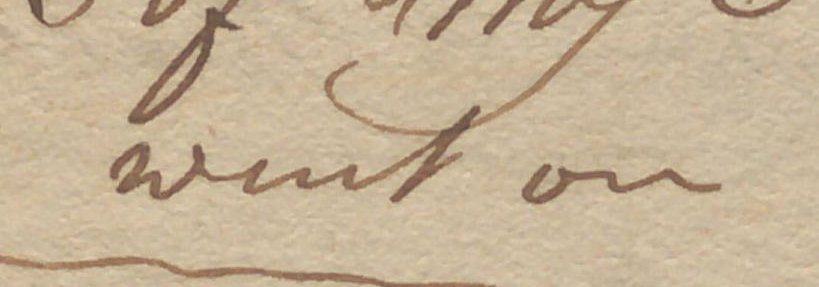went on
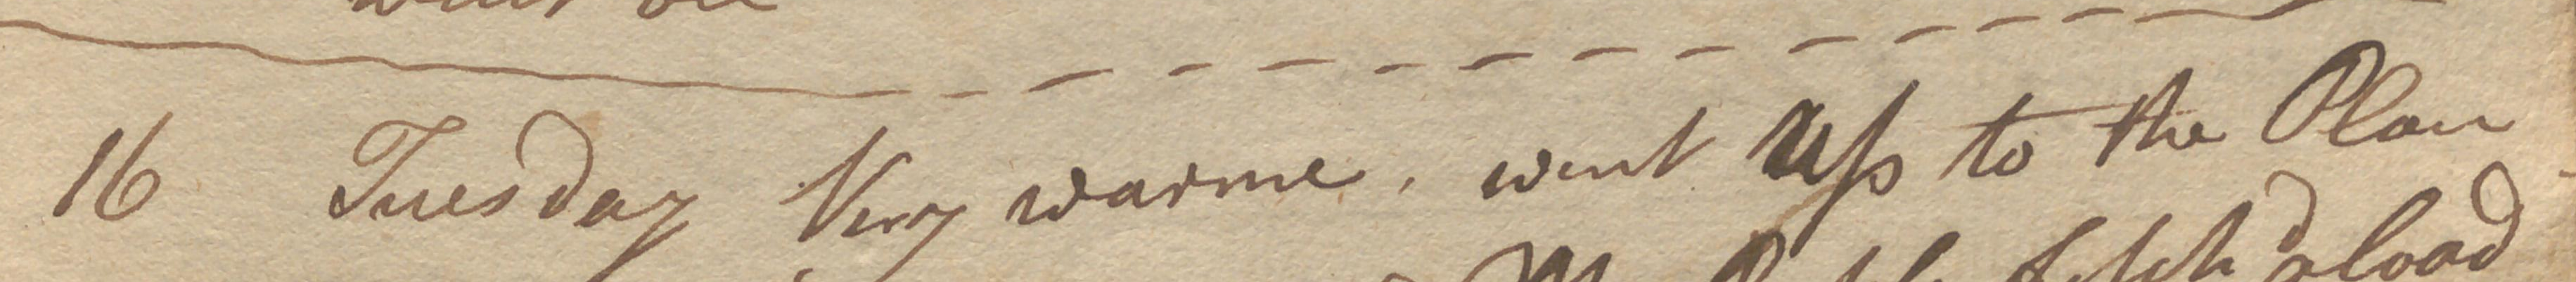16 Tuesday Vey warme, went up to the Plan
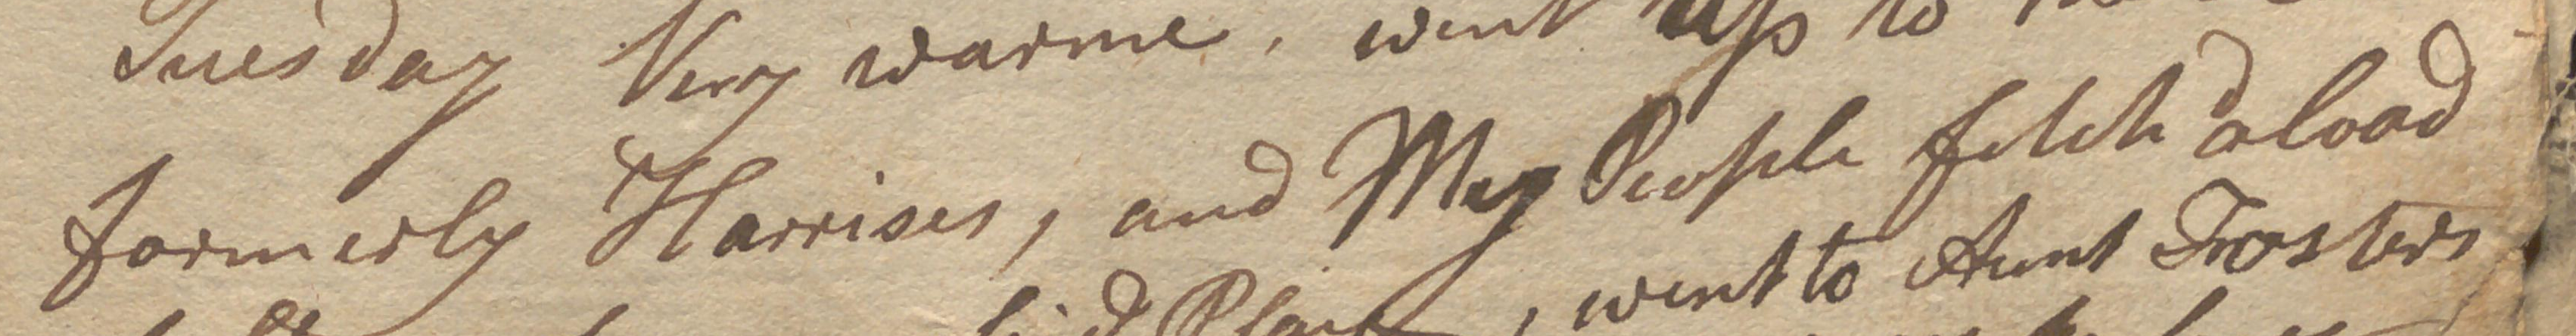formesly Harrises, and M People fetch^d a load
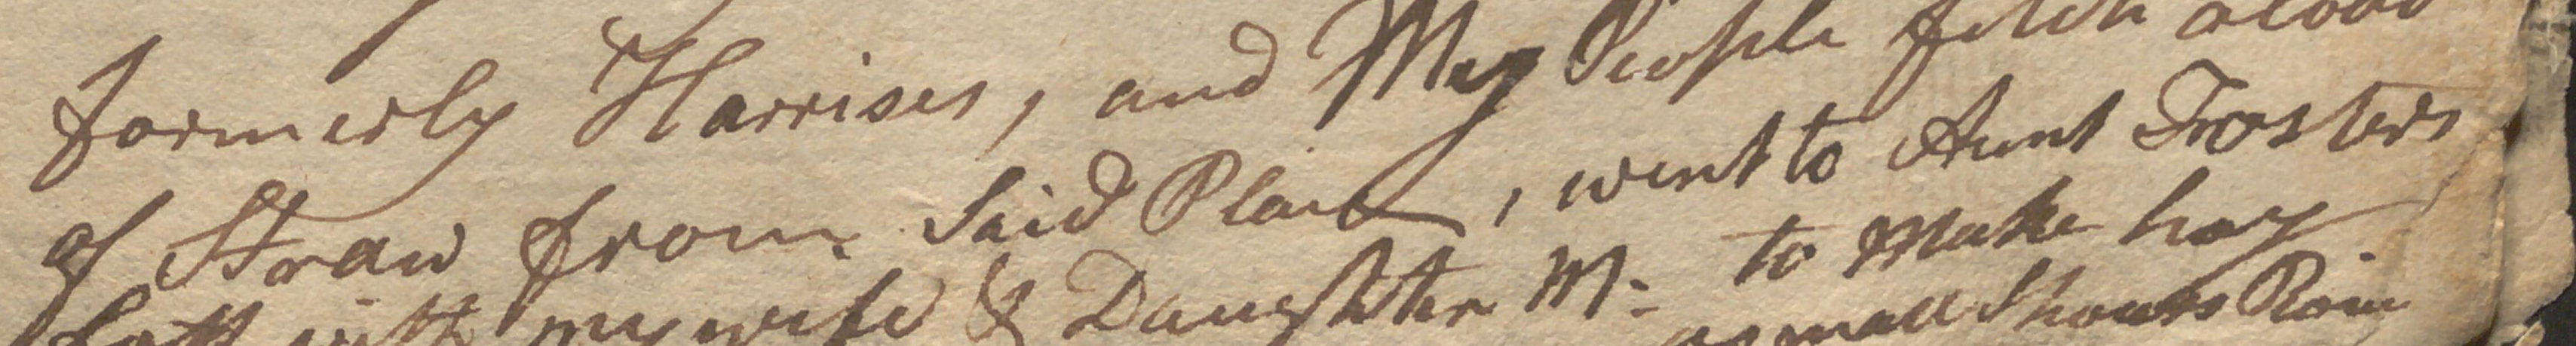of Straw from said Plan, went to Aunt Fosters
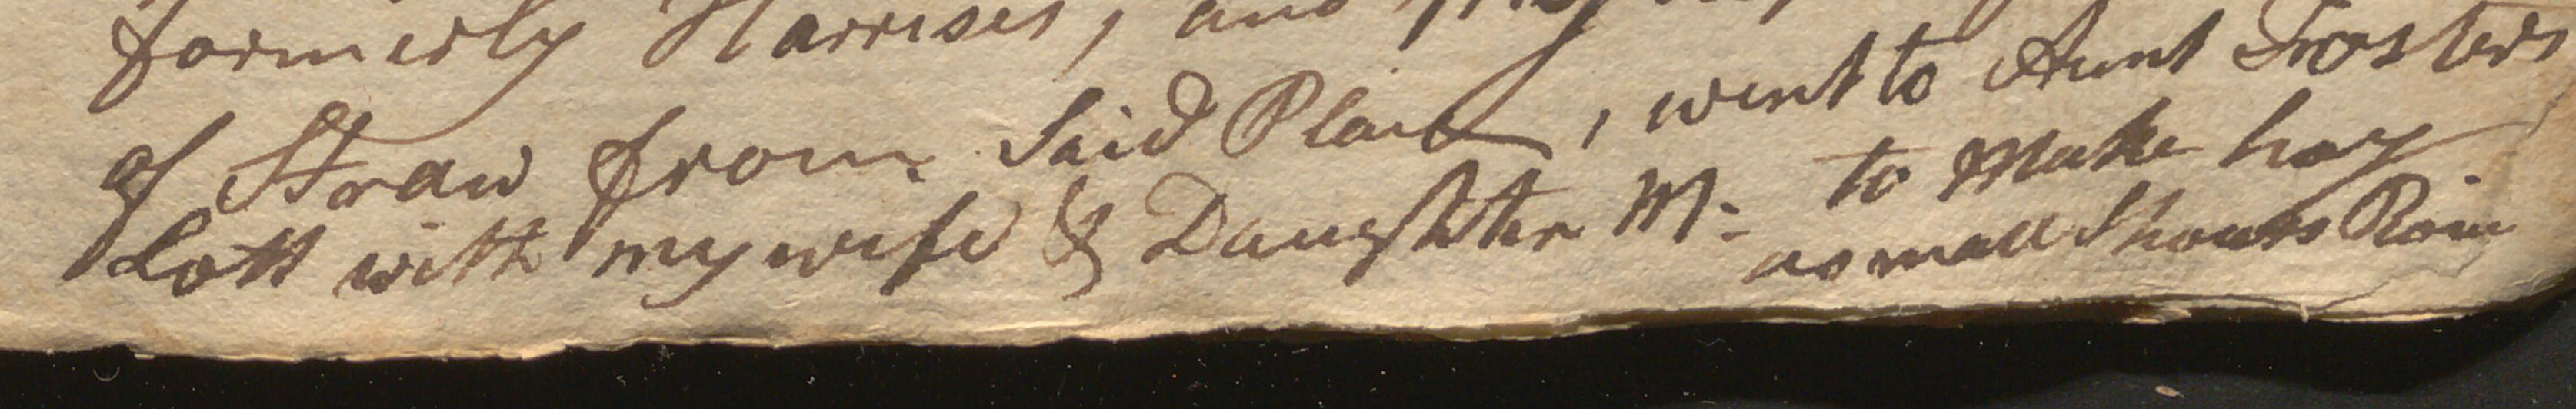Lott with my wife & Daughter M: to make hay
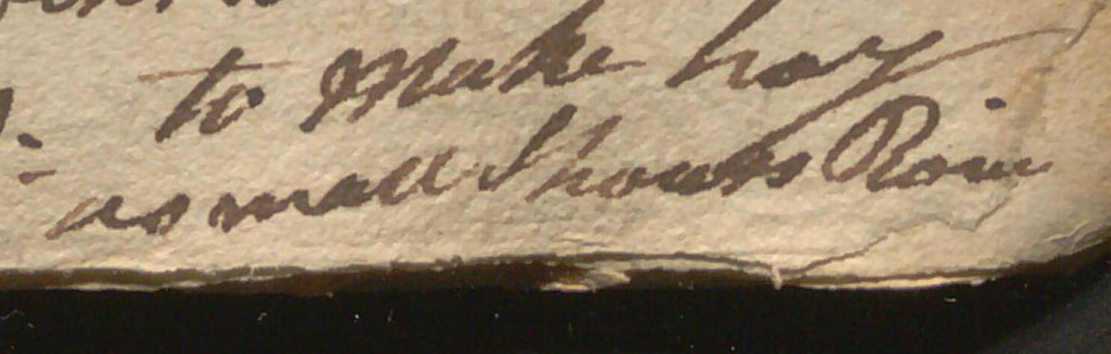a small shoure Rain
